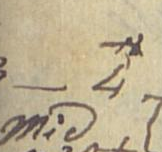4^th
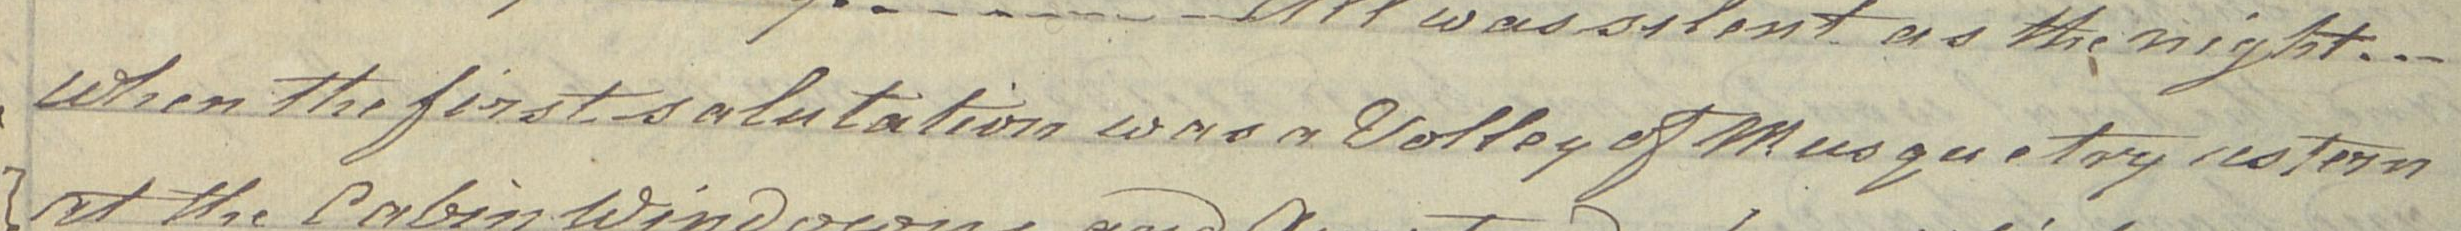When the first salutation was a Volley of Musquetry astern
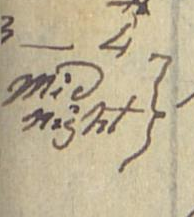night
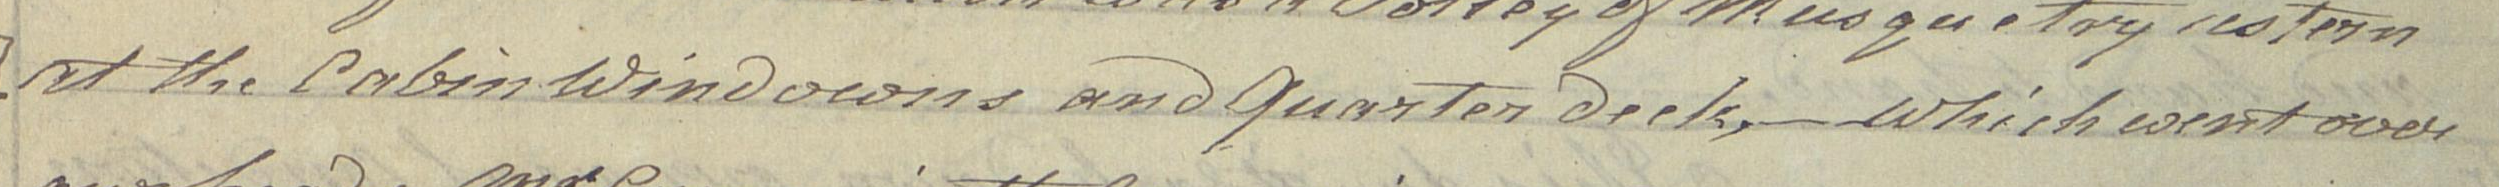at the Cabin Windowns and quarter deck, Which went over
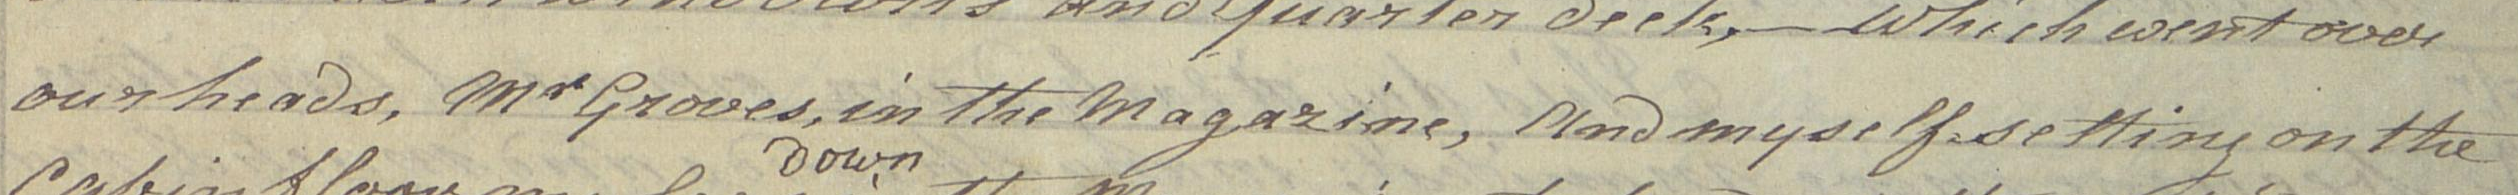our heads, M^r. Groves, in the Magazine, And myself setting on the
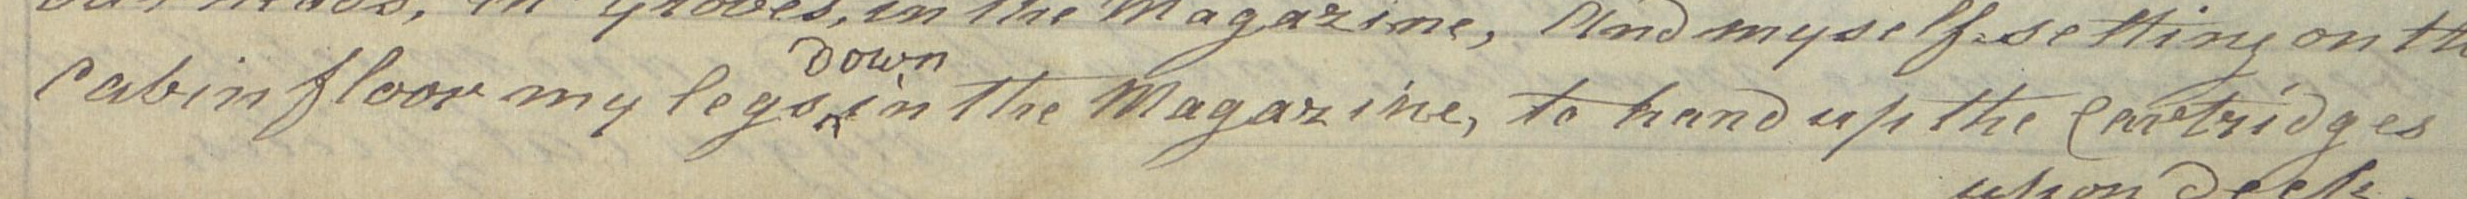cabin floor my legs ^ in the Magazine, to hand up the Cartridges
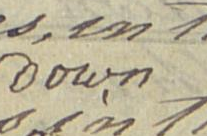down
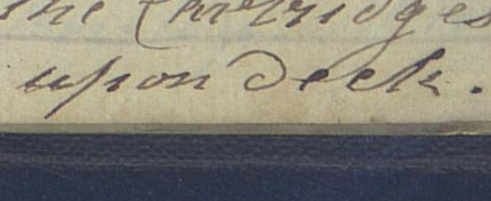upon deck.
